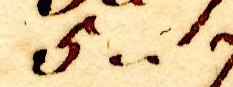5.7
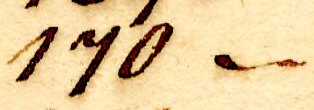170
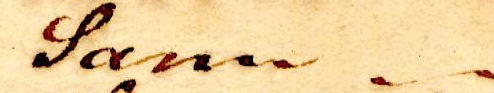Same
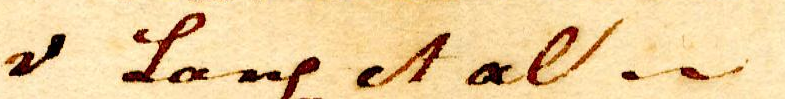v Lang et al-
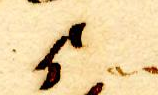5.7
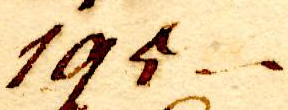195
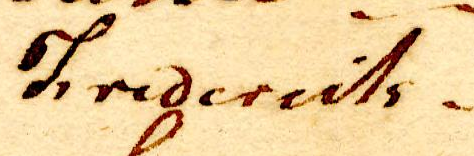Fridereils
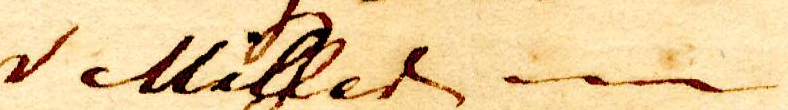v Miller-
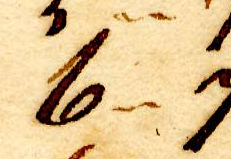6.7
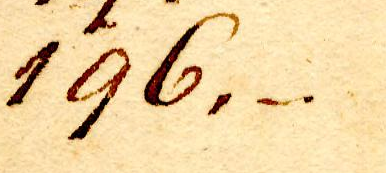196.
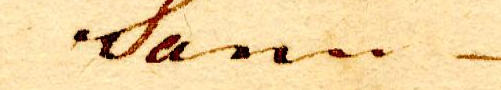Same
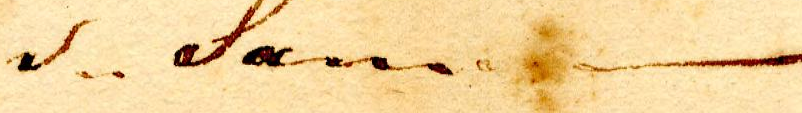v Same-
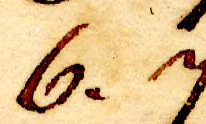6.7
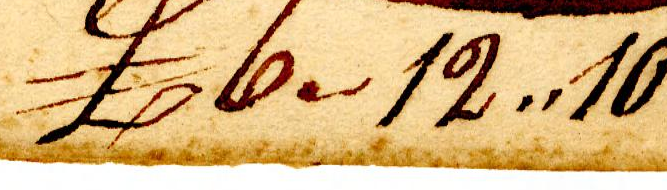£6..12..10
